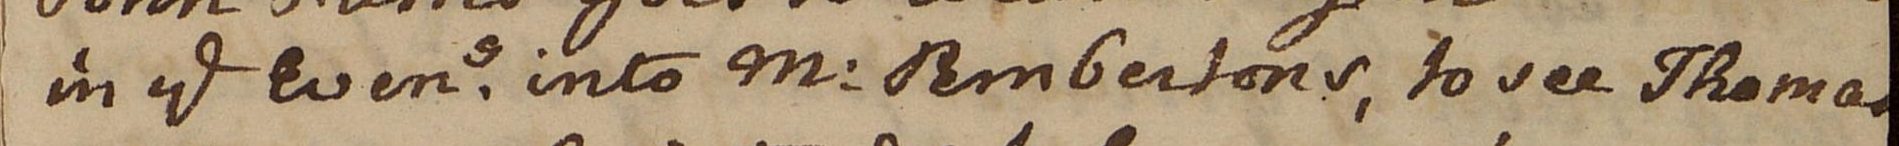in y^e Even^g. into M: Pembertons, to see Thomas
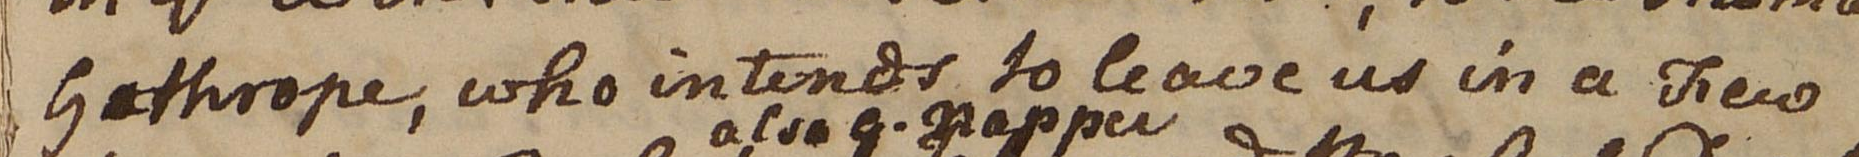Gathrope, who intends to leave us in a Few
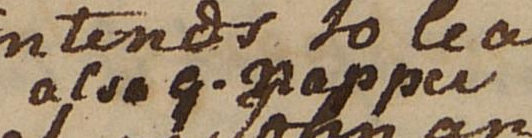also G. Pepper
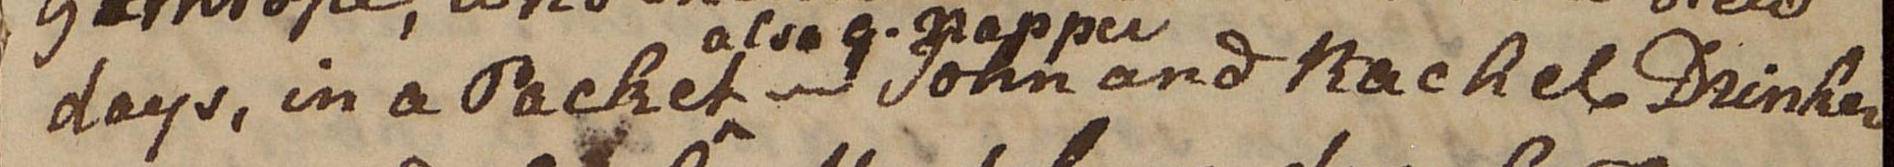days, in a Packet ^ - John and Rachel Drinker
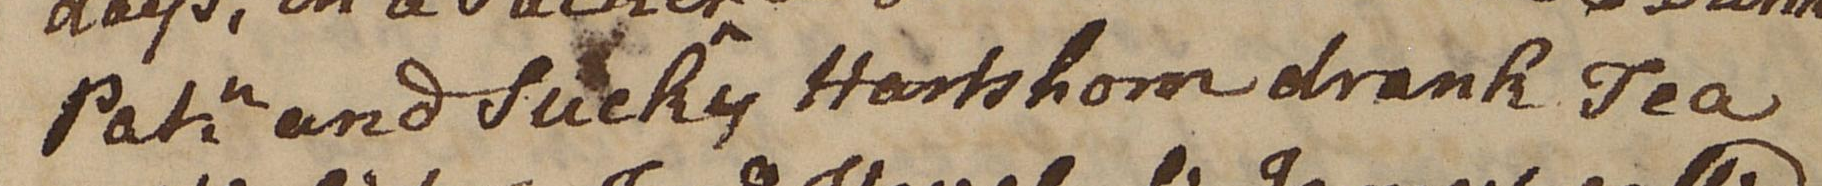Pat^n. and Sucky Hartshorn drank Tea
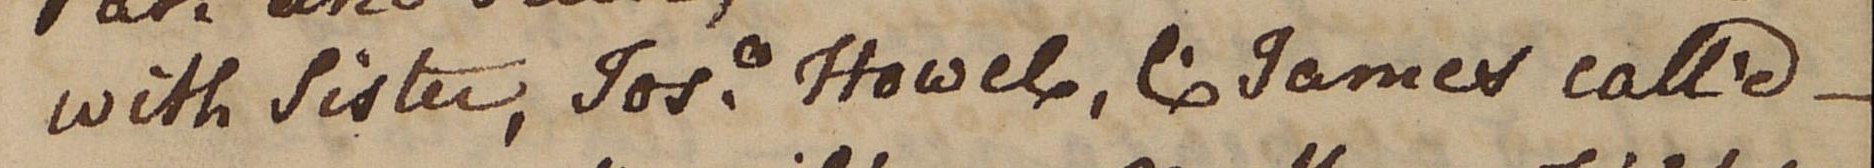with Sister, Jos^a. Howel, C. James call'd -
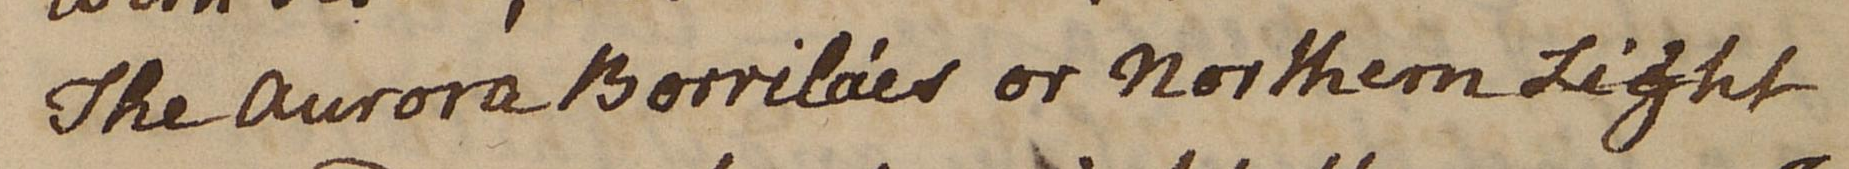The Aurora Borrilaes or Northern Light
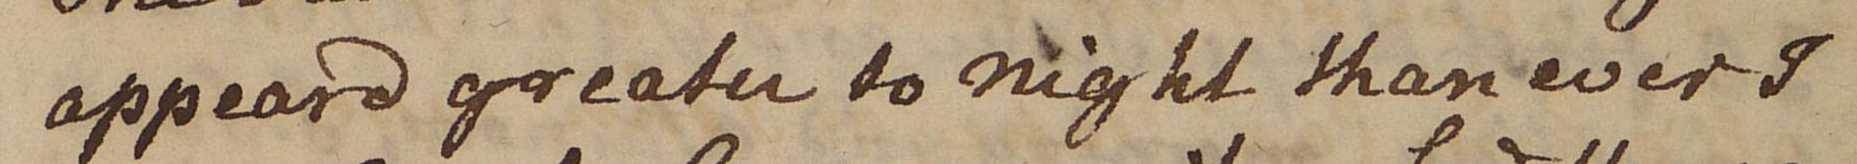appeard greater to night than ever I
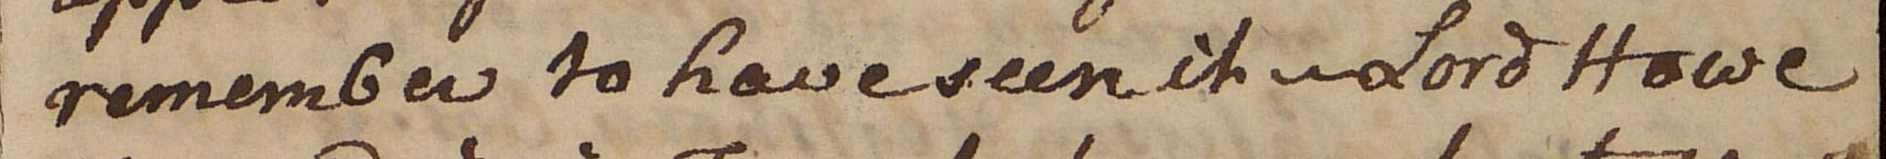remember to have seen it - Lord Howe
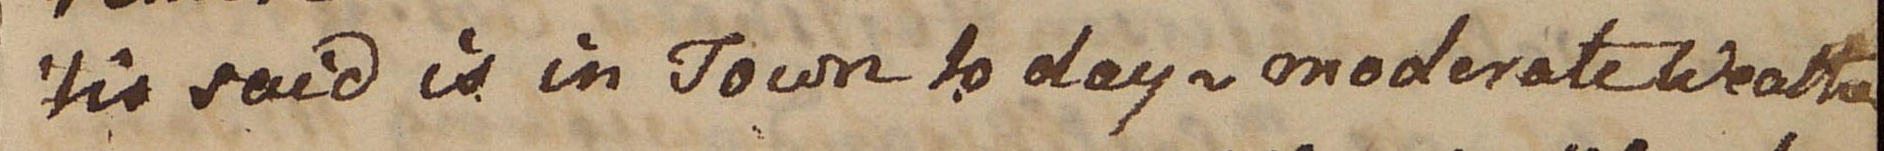'tis said is in Town to day - moderate weather
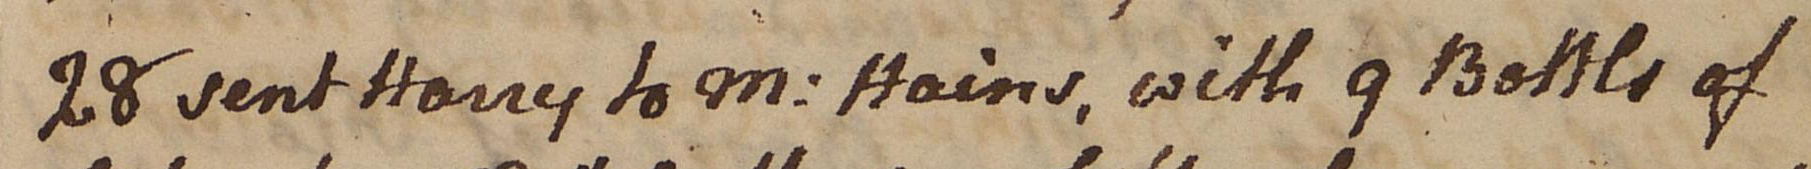28 sent Harry to M: Hains, with 9 Bottls of
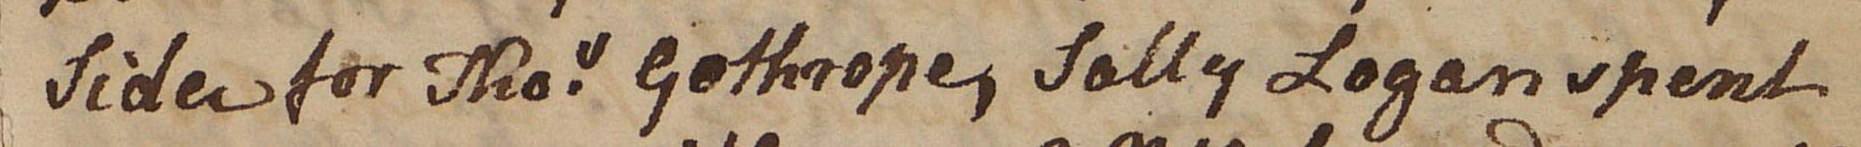Sider for Tho^s. Gathrope, Sally Lagan spent
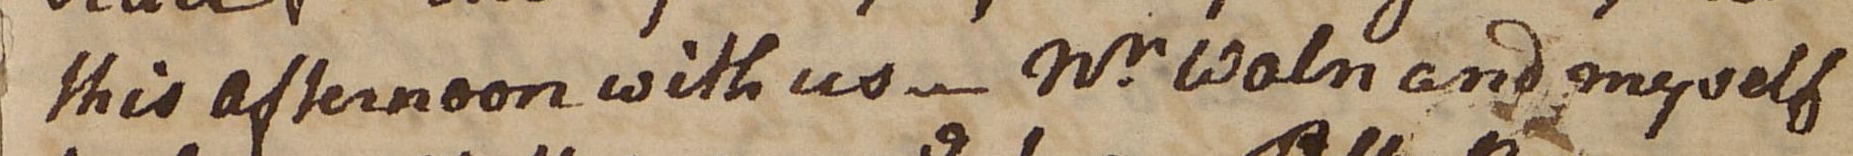this afternoon with us- N^r. Waln and myself
